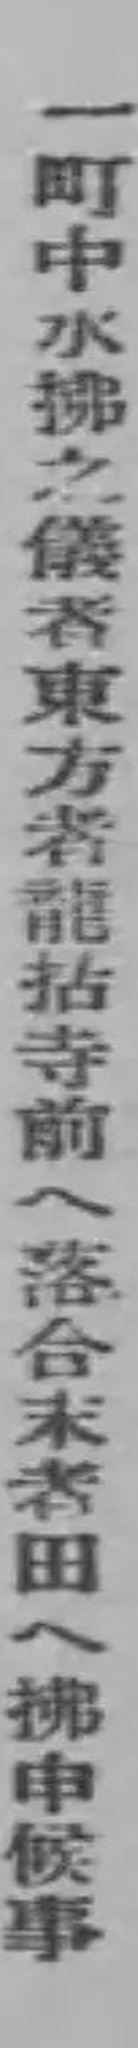一町中水払之儀者東方者龍拈寺前へ落合末者田へ払申候事
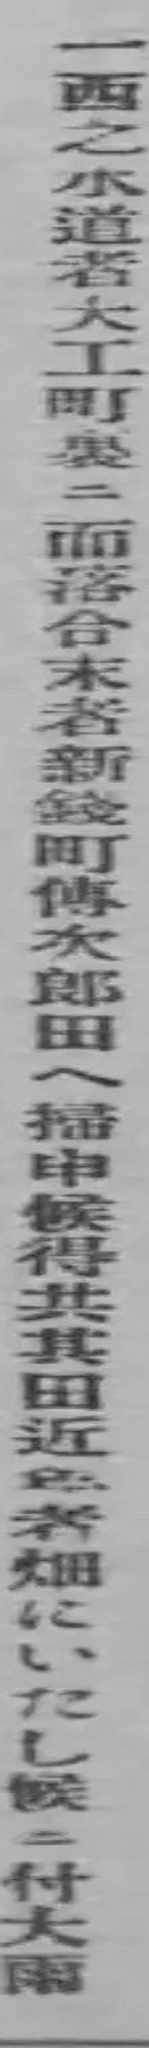一西之水道者大工町裏ニ而落合末者新銭町伝次郎田へ掃申候得共其田近年者畑にいたし候ニ付大雨
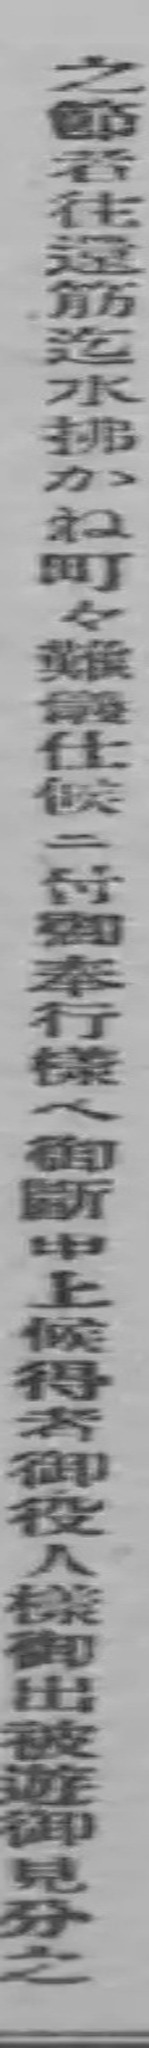之節者往還筋迄水払かね町々難儀仕候ニ付御奉行様へ御断申上候得者御役人様御出被遊御見分之
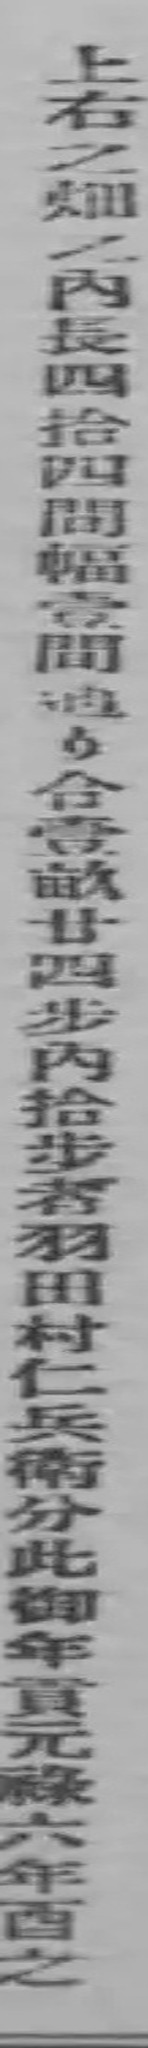上右之畑之内長四拾四間幅壱間通り合壱畝廿四歩内拾歩者羽田村仁兵衛分此御年貢元禄六年酉之
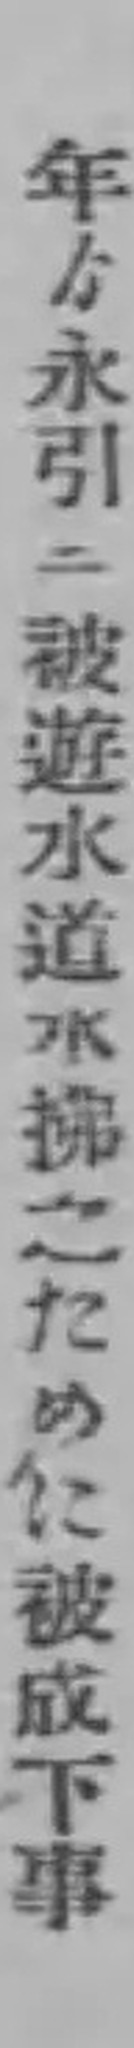年ゟ永引ニ被遊水道水払之ために被成下事
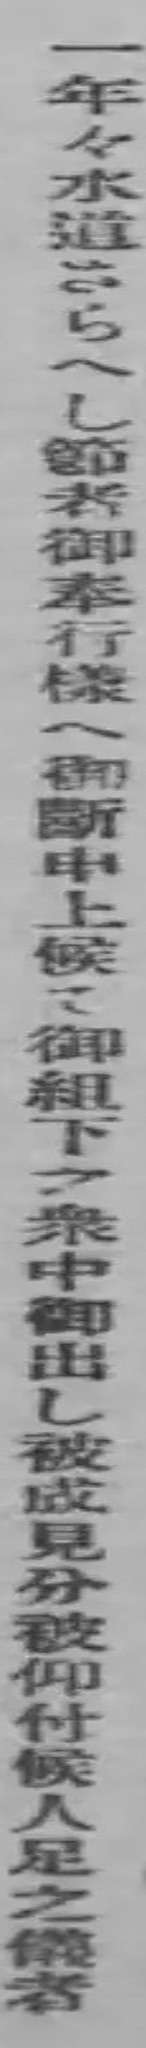一年々水道さらへし節者御奉行様へ御断申上候て御組下之衆中御出し被成見分被仰付候人足之儀者
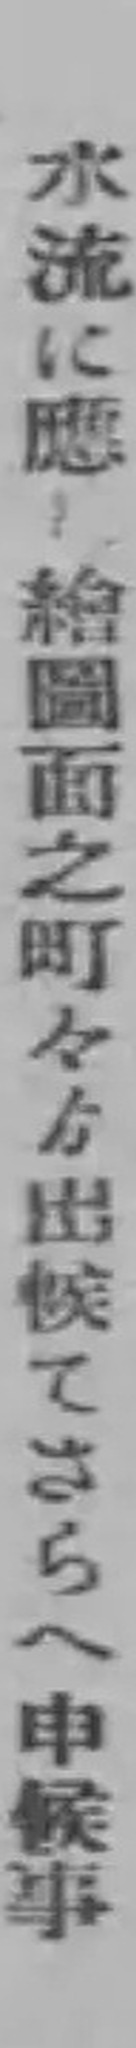水流に応じ絵図面之町々ゟ出候てさらへ申候事
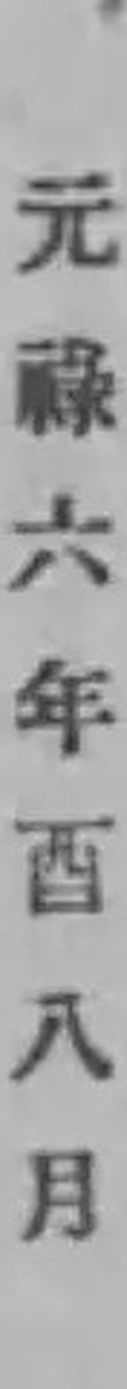元禄六年酉八月
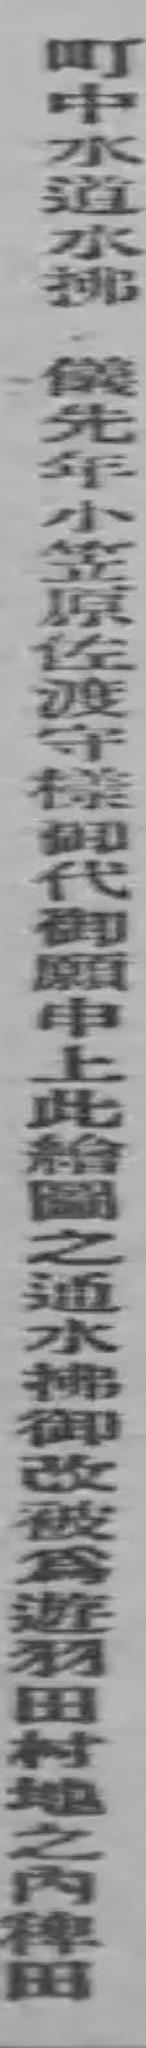町中水道水払之儀先年小笠原佐渡守様御代御願申上絵図之通水払御改被為遊羽田村地之内稗田
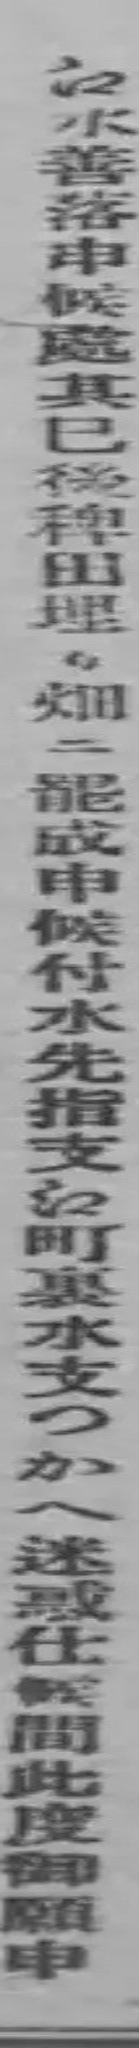え水善落申候処其巳後稗田埋り畑ニ罷成申候付水先指支え町裏水支つかへ迷惑仕候間此度御願申
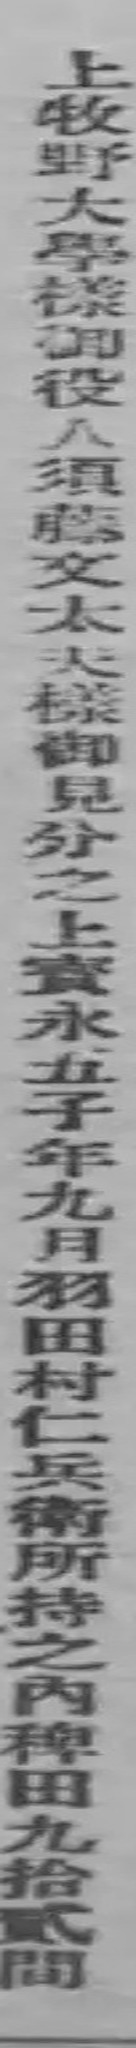上牧野大学様御役人須藤文太夫様御見分之上宝永五子年九月羽田村仁兵衛所持之内稗田九拾弐間
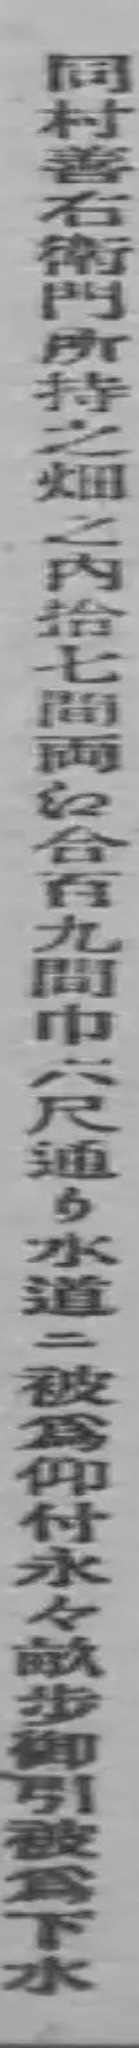同村善右衛門所持之畑之内拾七間両え合百九間巾六尺通り水道ニ被為仰付永々畝歩御引被為下水
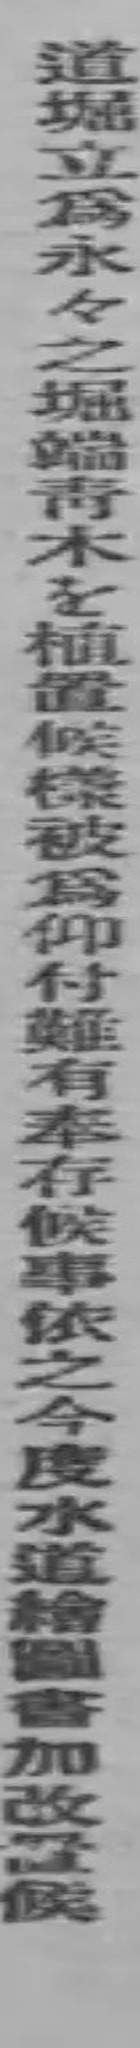道堀立為永々之堀端青木を植置候様被為仰付難有奉存候事依之今度水道絵図書加改置候
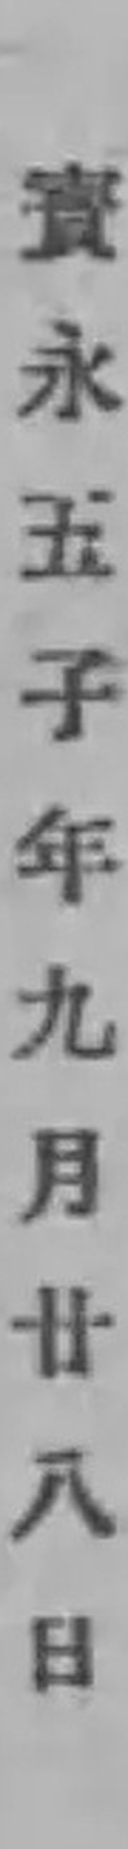宝永五子年九月廿八日
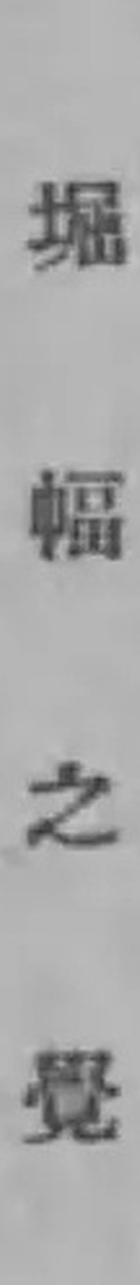堀幅之覚
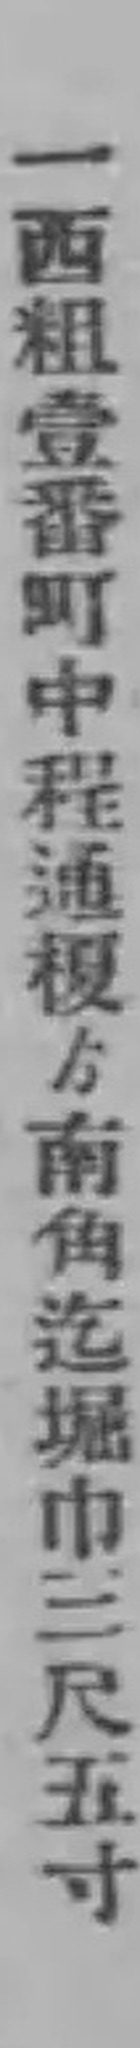一西粗壱番町中程通榎ゟ南角迄堀巾三尺五寸
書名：豊橋市史談
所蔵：国立国会図書館 National Diet Library, JAPAN
